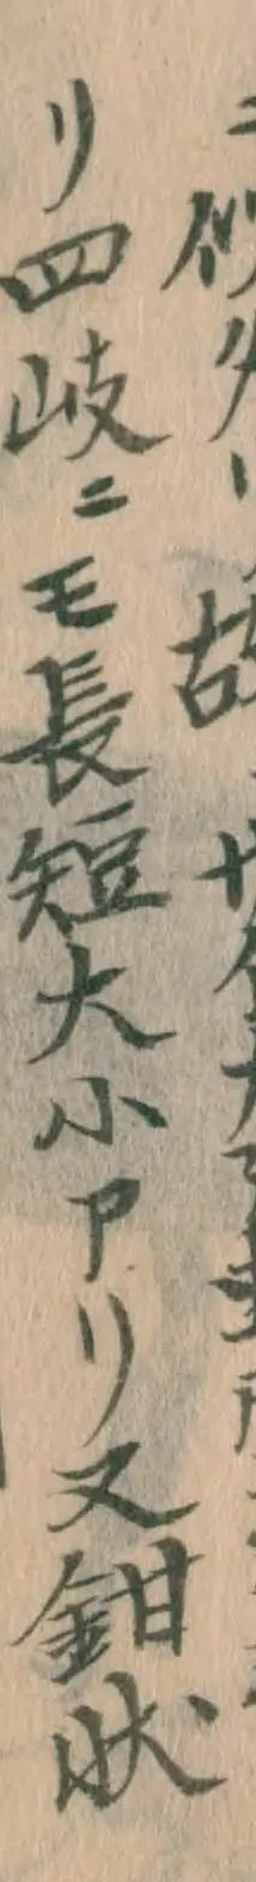リ四岐ニモ長短大小アリ又鉗状
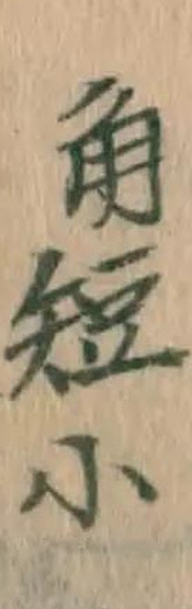角短小
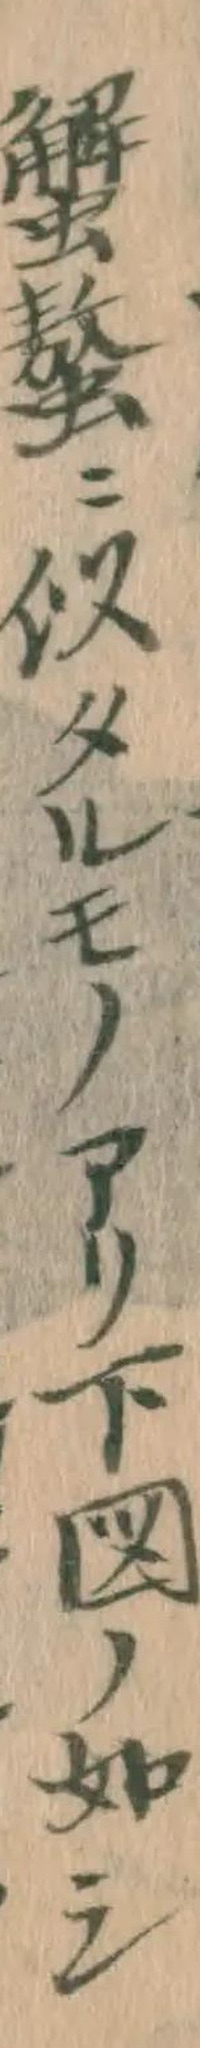蟹螯ニ似タルモノアリ下図ノ如シ
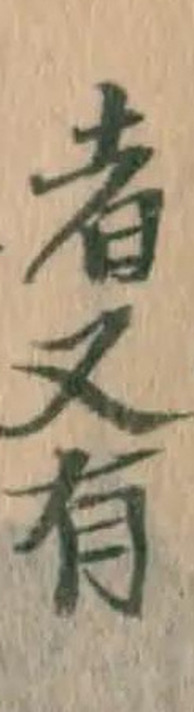者又有
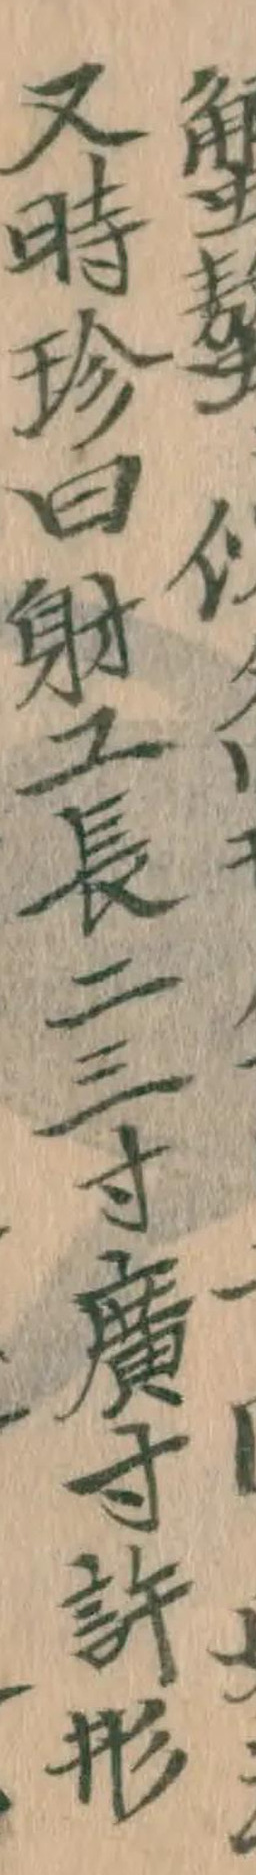又時珍曰射工長二三寸廣寸許形
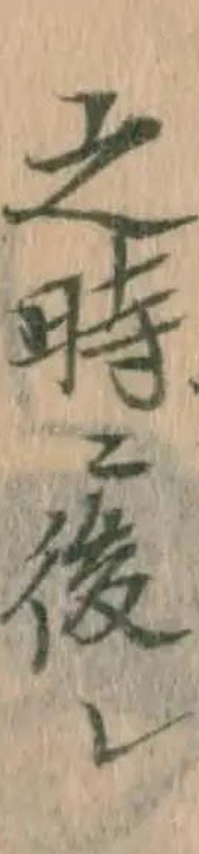之時ニ後レ
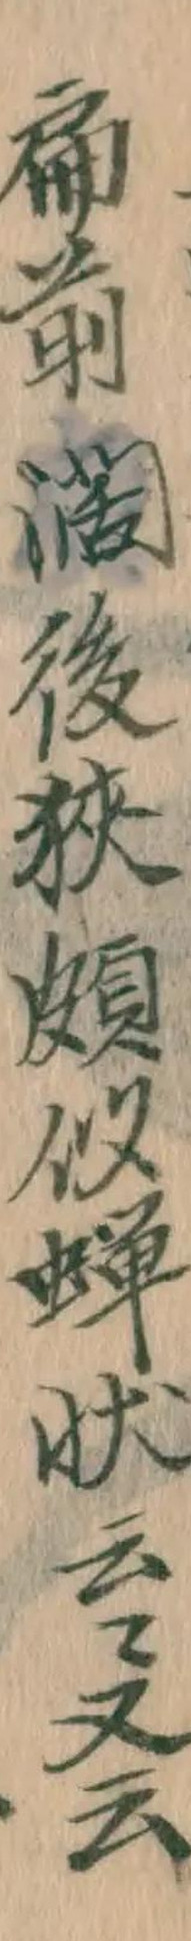扁前濶後狹頗似蝉状云々又云
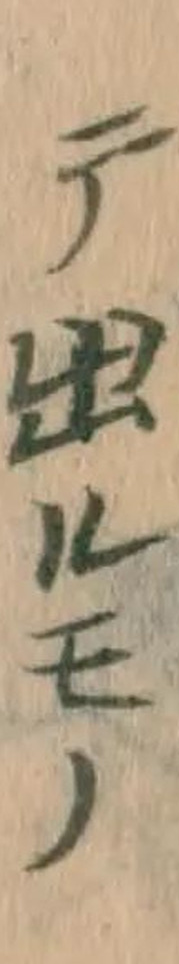テ出ルモノ
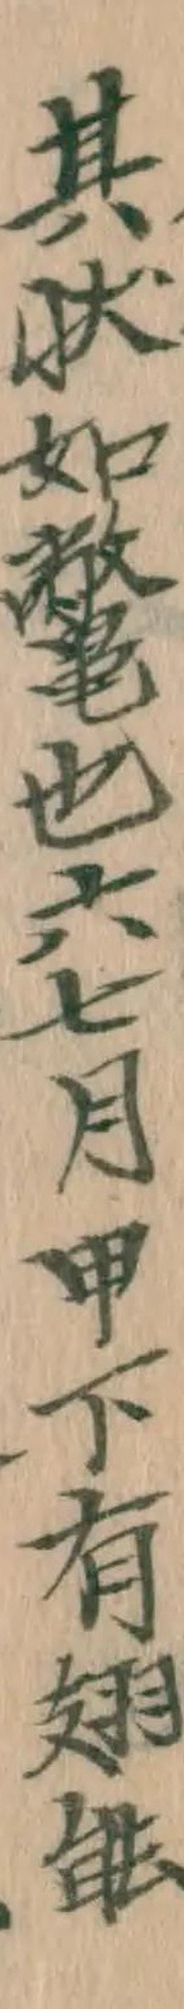其状如鼈也六七月甲下有翅能
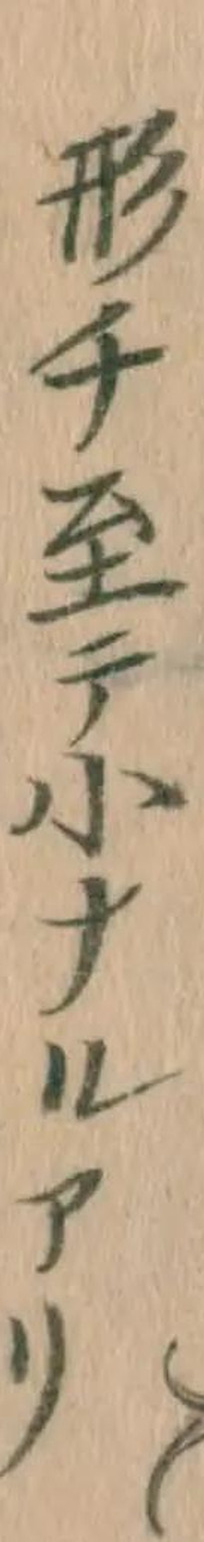形チ至テ小ナルアリ
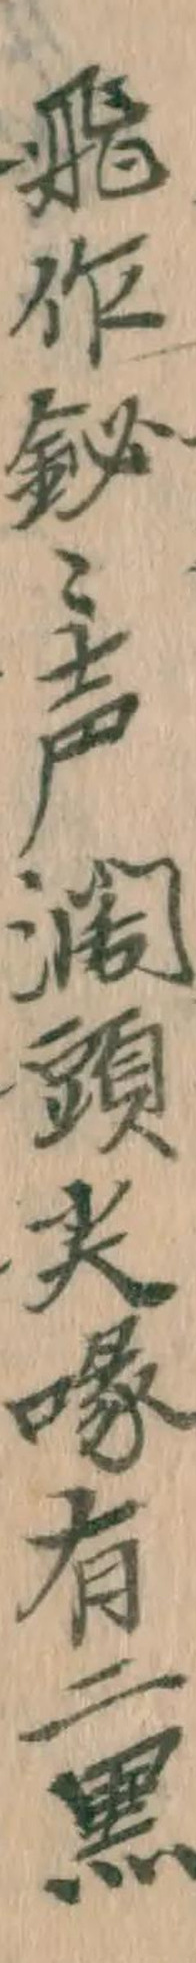飛作鉍々声濶頭尖喙有二黒
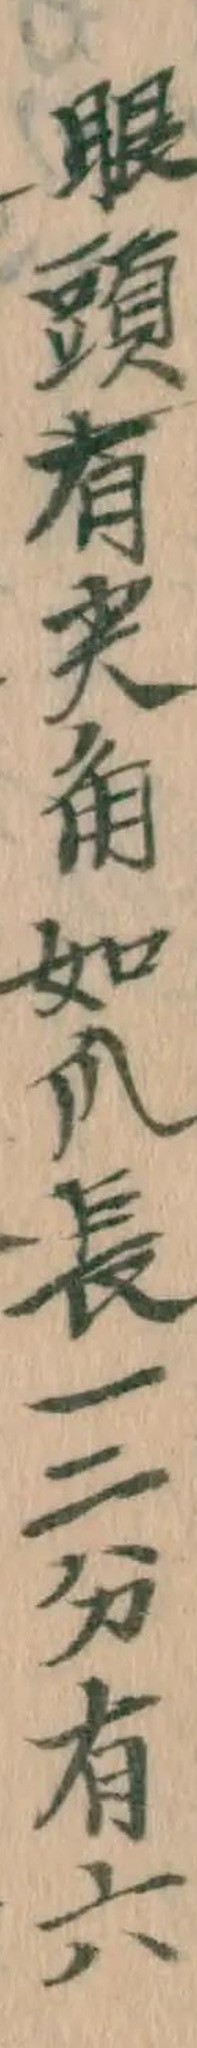眼頭有尖角如爪長一二分有六
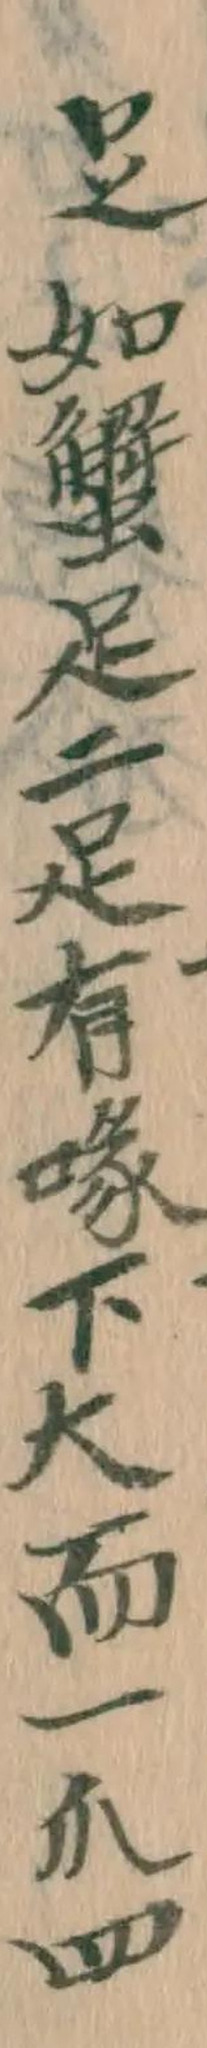足如蟹足二足有喙下大而一爪四
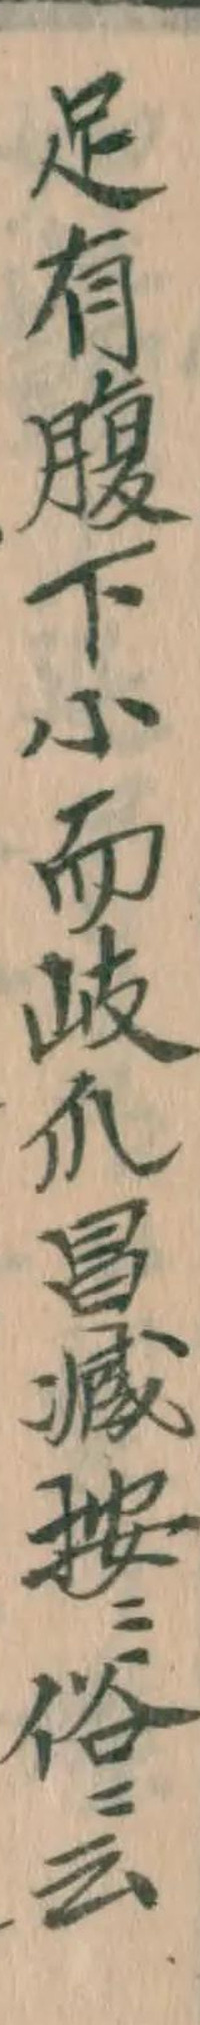足有腹下小而岐爪昌臧按ニ俗ニ云
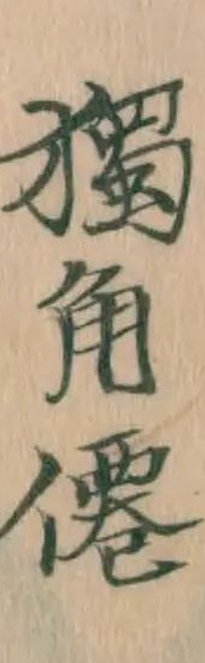獨角僊
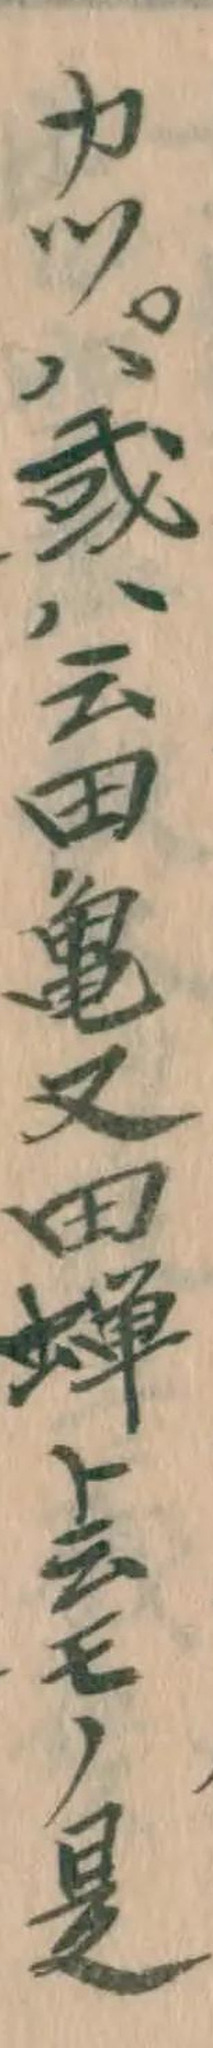カツパ或ハ云田亀又田蝉ト云モノ是
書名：千蟲譜 3巻. [1]
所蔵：国立国会図書館 National Diet Library, JAPAN
